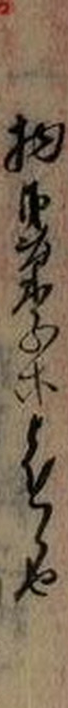物御菓子等被進候由
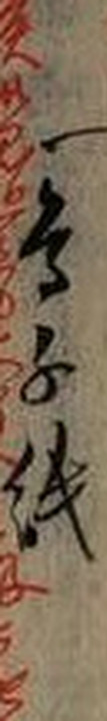鳥子紙
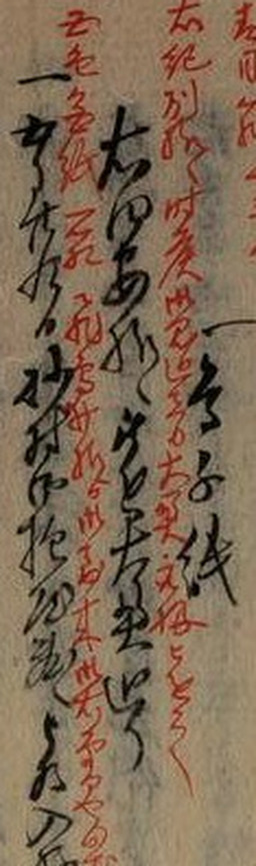右田安様へ被進大奥廻り
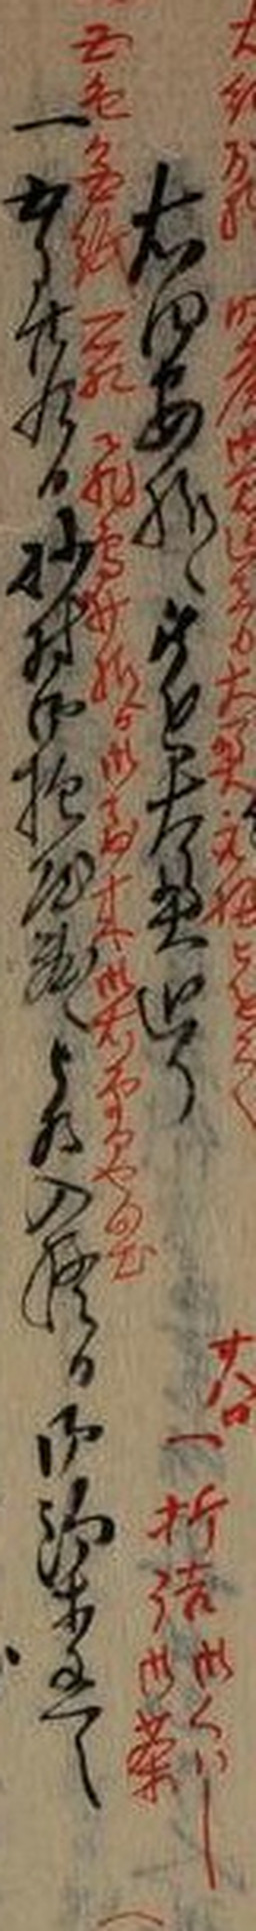一五月廿九日砂村御抱屋敷へ被為入終日御釣等有之
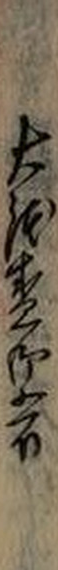大鉢盛御肴一台
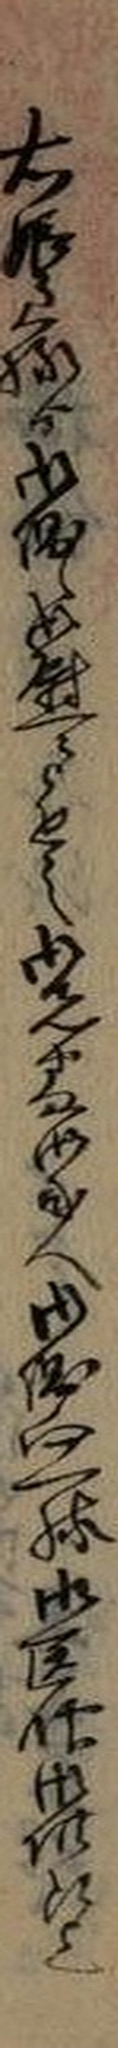右姫君様ゟ御側之御慰ニ被進之御先番御用人御側向一統御医師御供頭迄
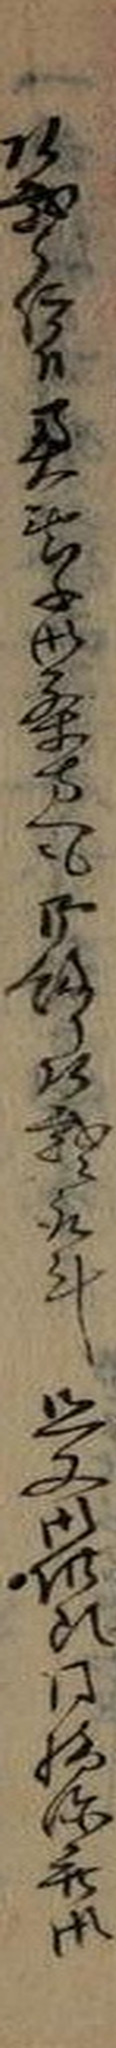頂戴被仰付奥台子御茶方へも御餘り頂戴ニ取計且又御供頭同指添并御
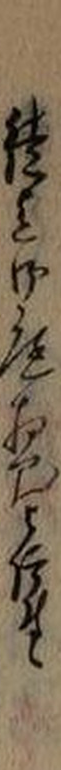徒迄御庭拝見被仰付候
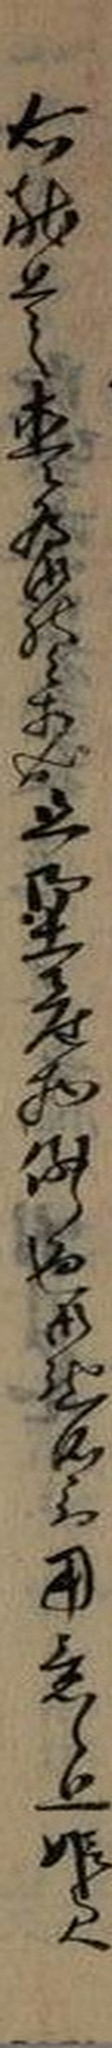右献上之直ニ為御持ニ相成且御土産物例之通御台所ニ而用意之上姫君
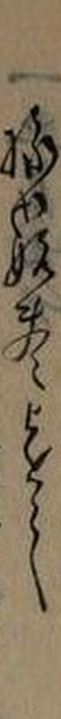様御始夫々被進之
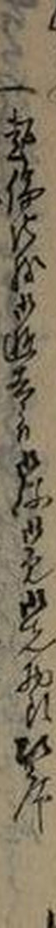超倫院様御逝去ニ付御役御免御先物頭次席
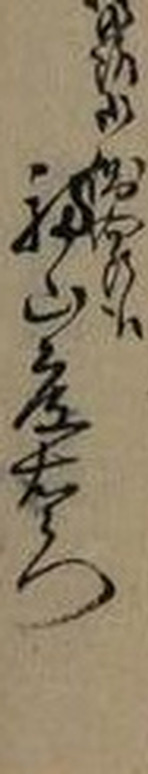福山藤右衛門
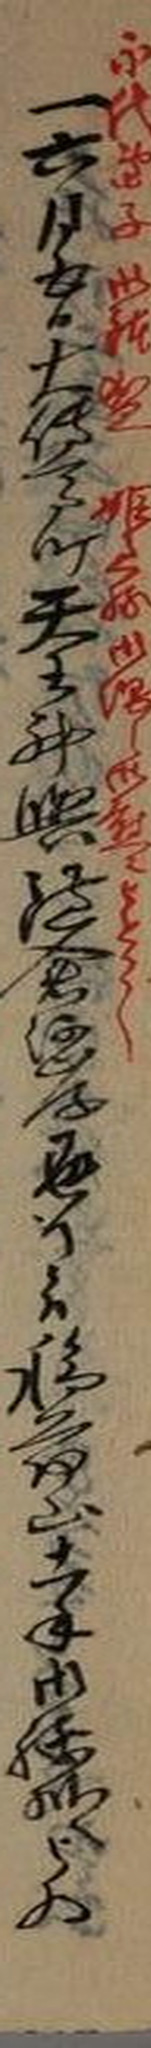一六月五日大伝馬町天王神輿鎌倉河岸通り候付稲荷山土手御腰掛へ被為
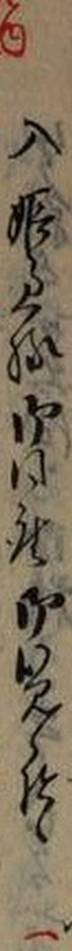入姫君様御同座御覧被遊候
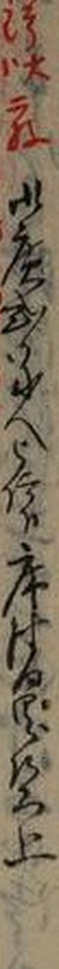御広敷御用人被仰付席津田四郎左衛門上
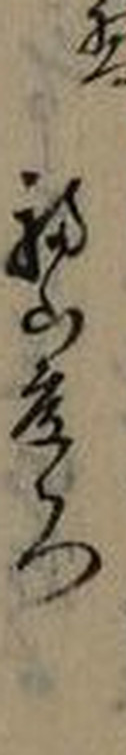福山藤右衛門
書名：少傅日録抄（斉承付側向頭取日記、在府）
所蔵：福井県文書館 Fukui Prefectural Archives
